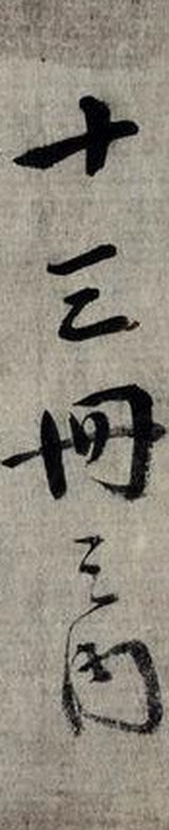十三冊之内

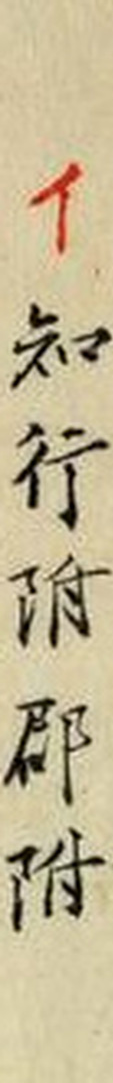イ知行附郡附
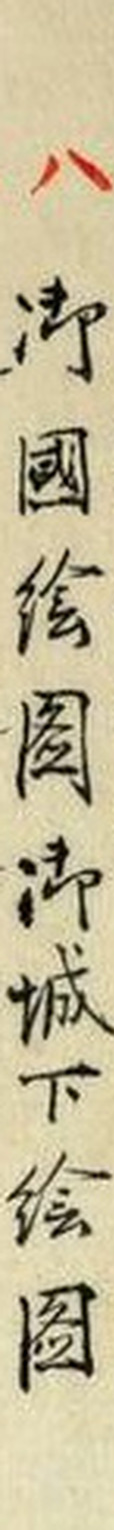ハ御国絵図御城下絵図
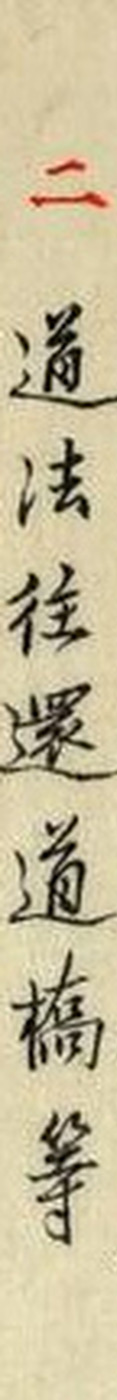ニ道法往還道橋等
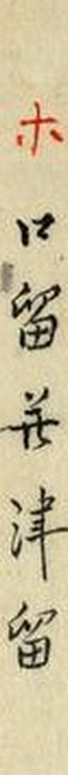ホ口留并津留
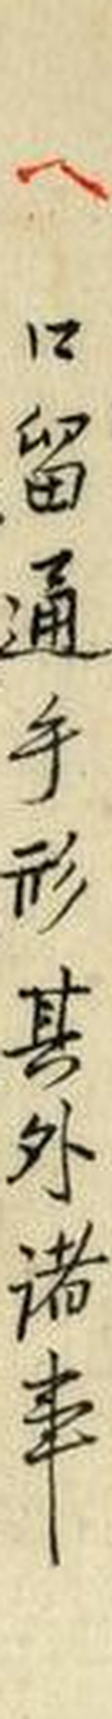ヘ口留通手形其外諸事
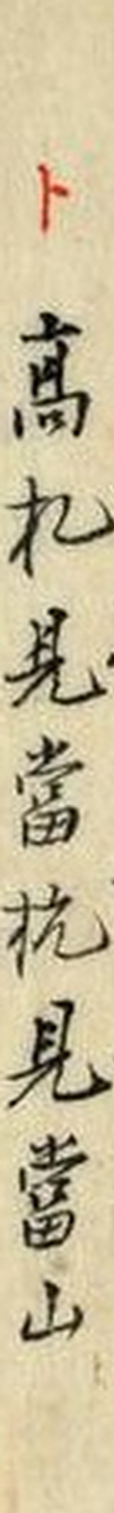ト高札見当杭見当山
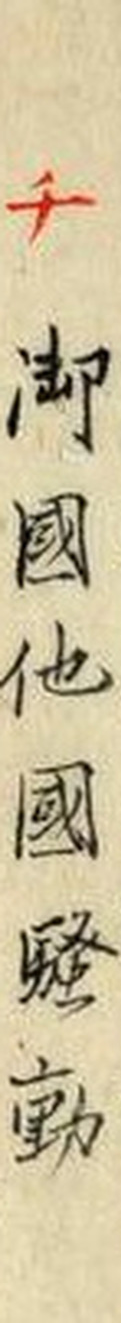チ御国他国騒動
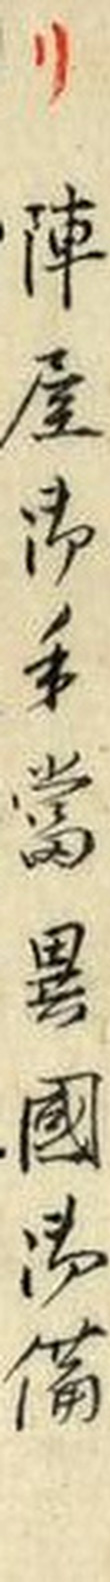リ陣屋御手当異国御備
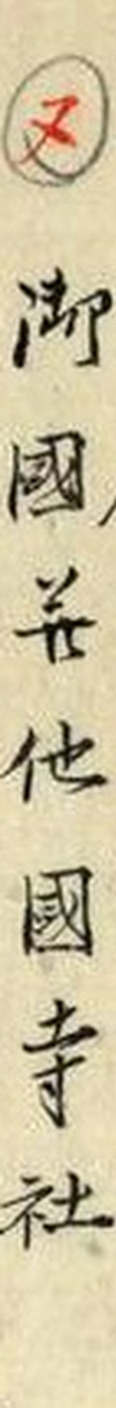ヌ御国并他国寺社
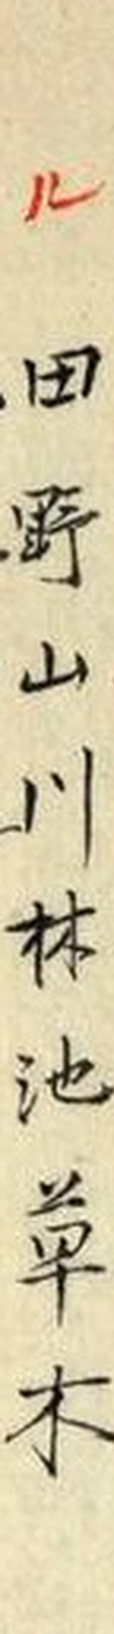ル田野山川林池草木
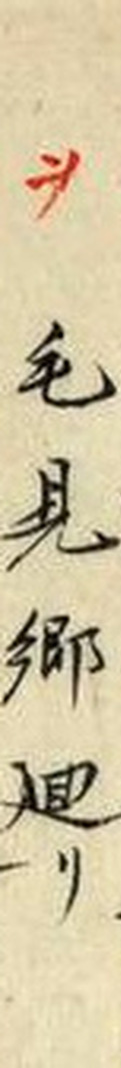ヲ毛見郷廻リ
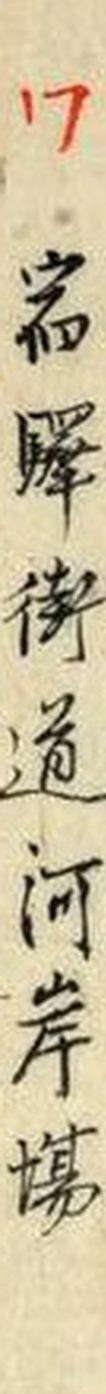ワ宿駅街道河岸場
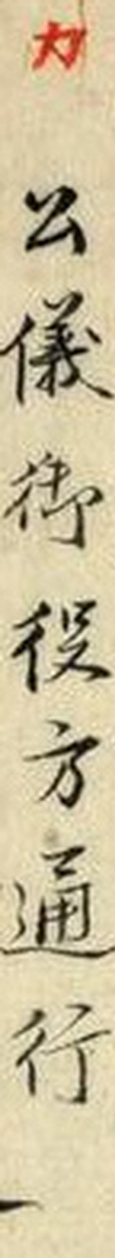カ公儀御役方通行
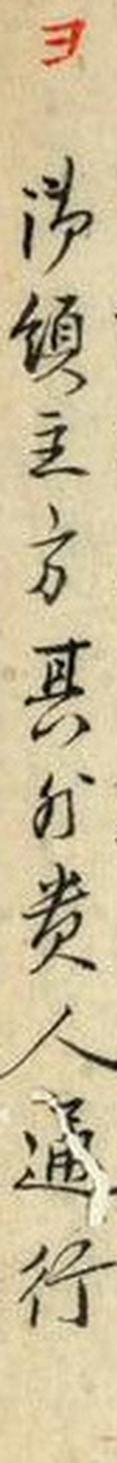ヨ御領主方其外貴人通行

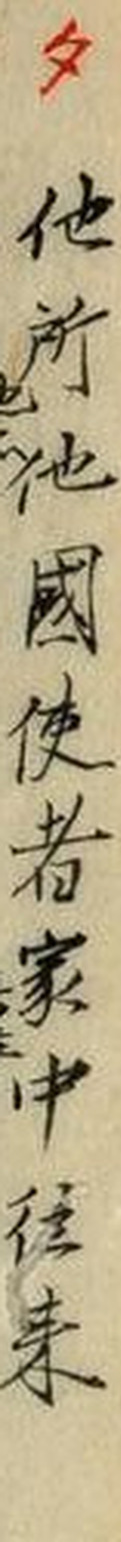タ他所他国使者家中往来
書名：御国他国諸事之部
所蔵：福井県文書館 Fukui Prefectural Archives
